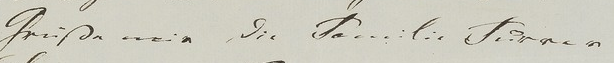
Grüße mir die Familie Furrer
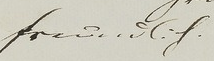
freundlich.
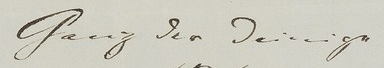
Ganz der Deinige
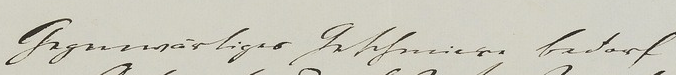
Gegenwärtiges Geschmiere bedarf
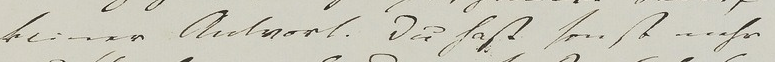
keiner Antwort. Du hast sonst mehr
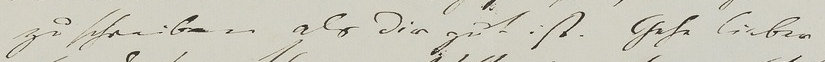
zu schreiben als dir gut ist. Gehe lieber
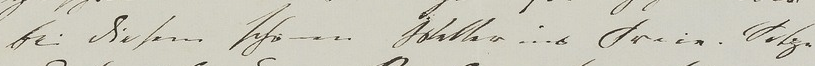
bei diesem schönen Wetter ins Freie. Setze
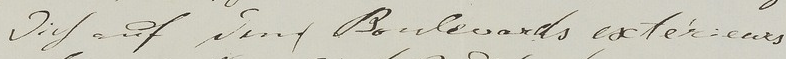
Dich auf den Boulevards extérieurs
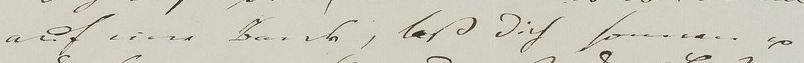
auf eine Bank, laß Dich sonnen &
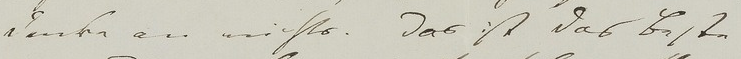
denke an nichts. Das ist das Beste
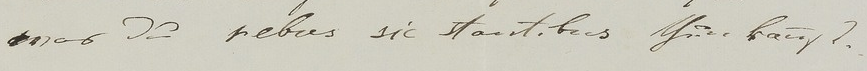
was Du rebus sic stantibus thun kannst.
